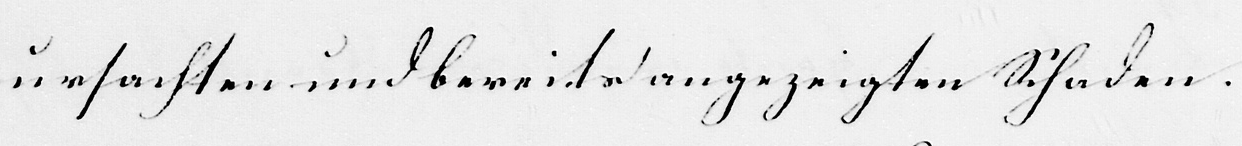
ursachten und bereits angezeigten Schaden.
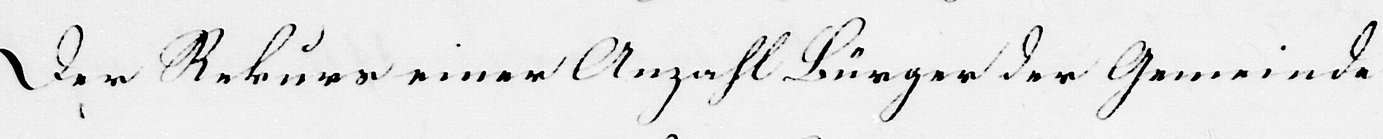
Der Rekurs einer Anzahl Bürger der Gemeinde
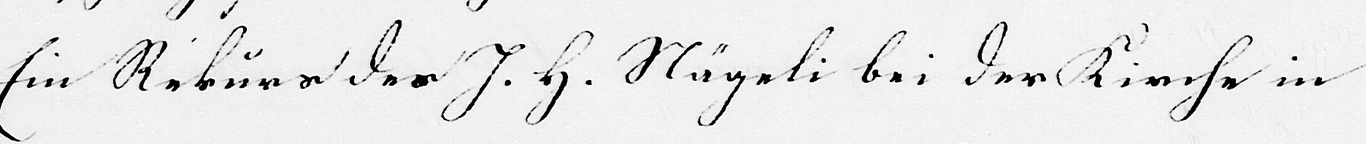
Ein Rekurs des J. H. Nägeli bei der Kirche in
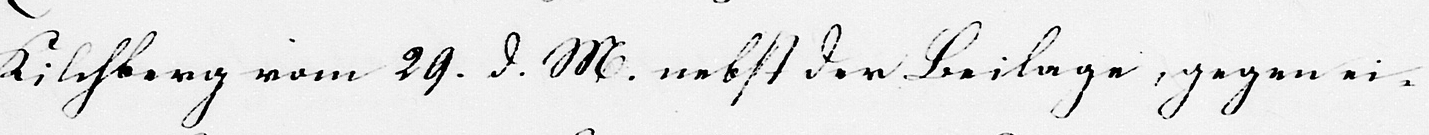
Kilchberg vom 29. d. M. nebst der Beilage gegen ei¬
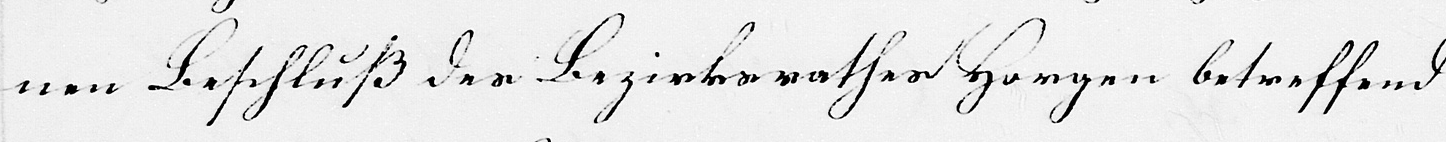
nen Beschluß des Bezirksrathes Horgen betreffend
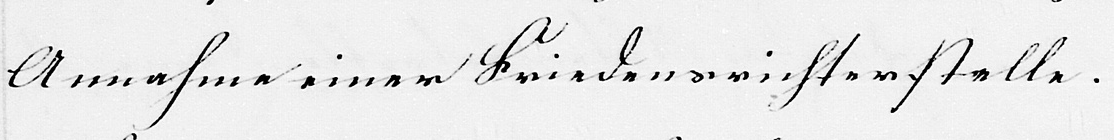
Annahme einer Friedensrichterstelle.
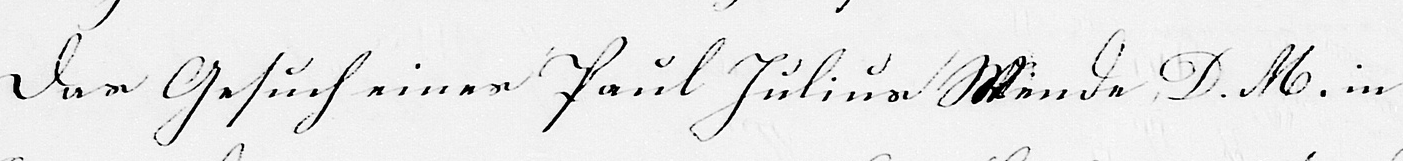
Das Gesuch eines Paul Julius Mende D. M. in
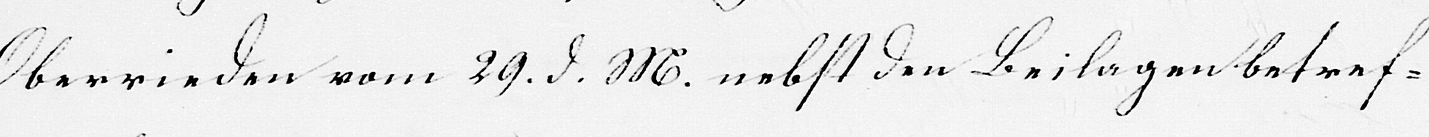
Oberrieden vom 29. d. M. nebst den Beilagen betref¬
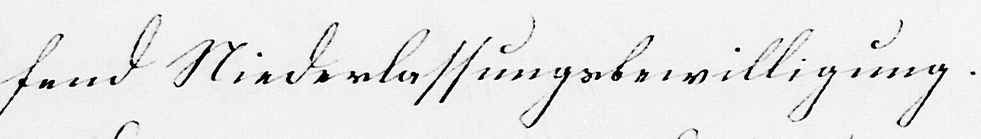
fend Niederlassungsbewilligung.
